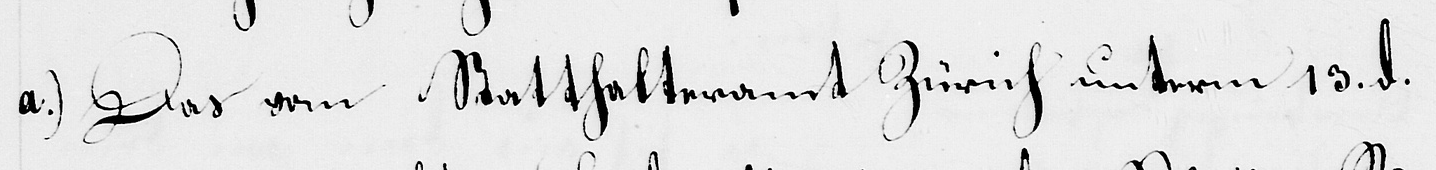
a.) Das vom Statthalteramt Zürich unterm 13. d.
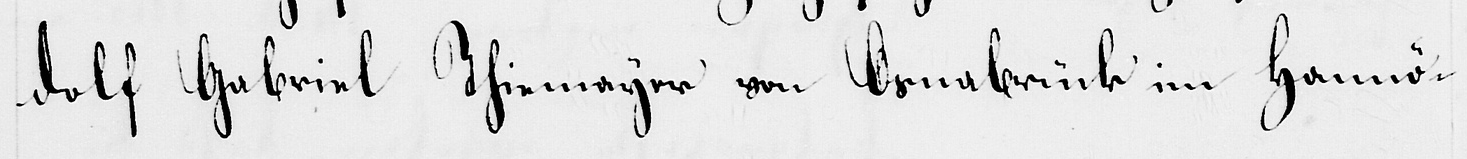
dolf Gabriel Thiemayer von Osnabrück im Hanno¬
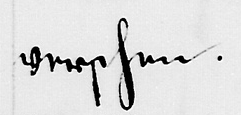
verschen.
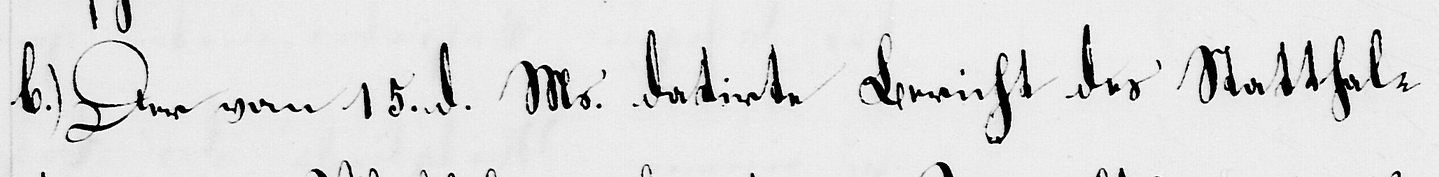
b.) Der vom 15. d. Ms. datirte Bericht des Statthal¬
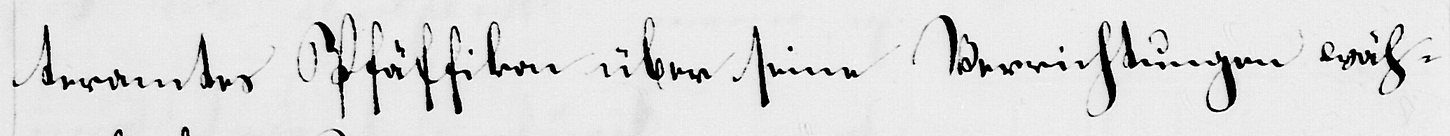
teramtes Pfäffikon über seine Verrichtungen wäh¬
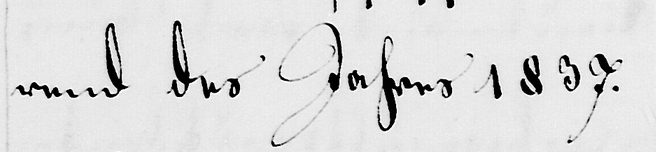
rend des Jahres 1837.
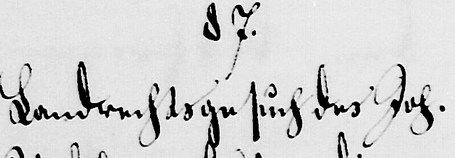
Landrechtsgesuch des Joh¬
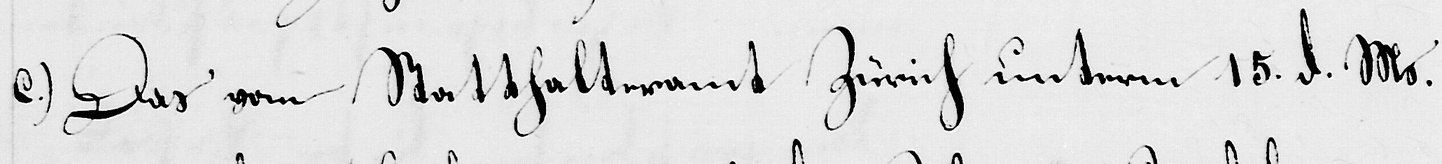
c.) Das vom Statthalteramt Zürich unterm 15. d. Ms.
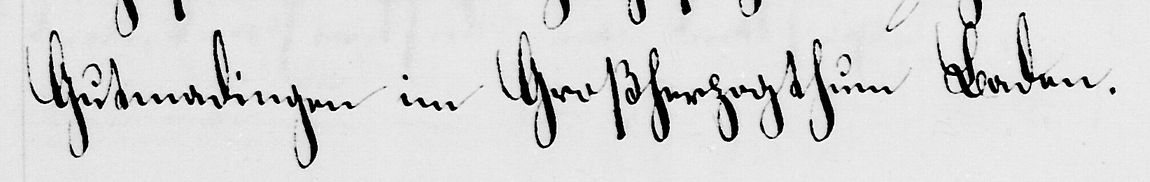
Gutmadingen im Großherzogthum Baden.
